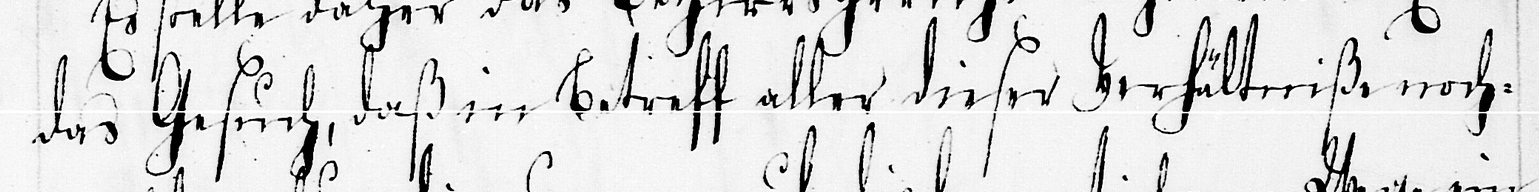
das Gesuch, daß in Betreff aller dieser Verhältniße noch¬
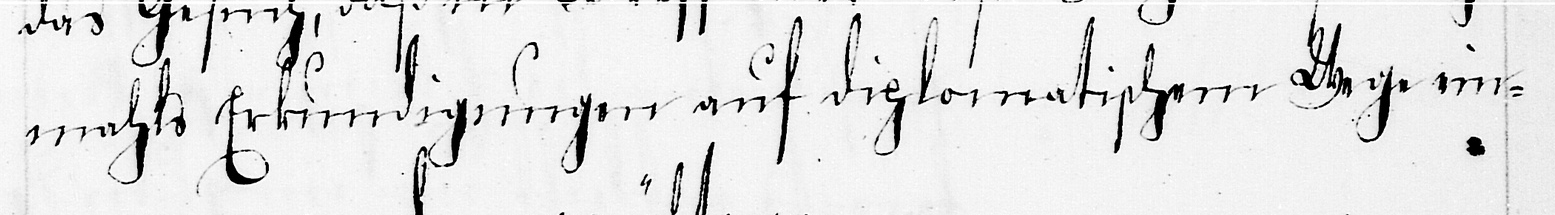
mahls Erkundigungen auf diplomatischem Wege ein¬
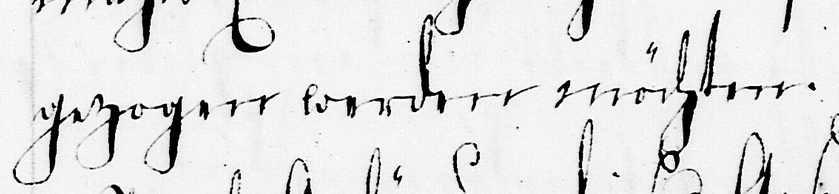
gezogen werden möchten.
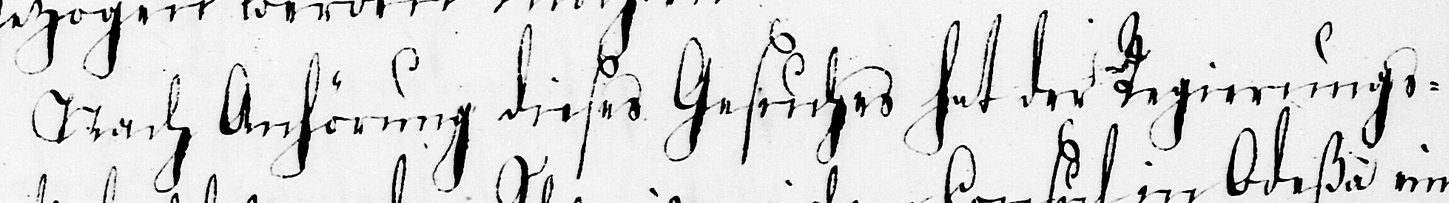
Nach Anhörung dieses Gesuches hat der Regierungs¬
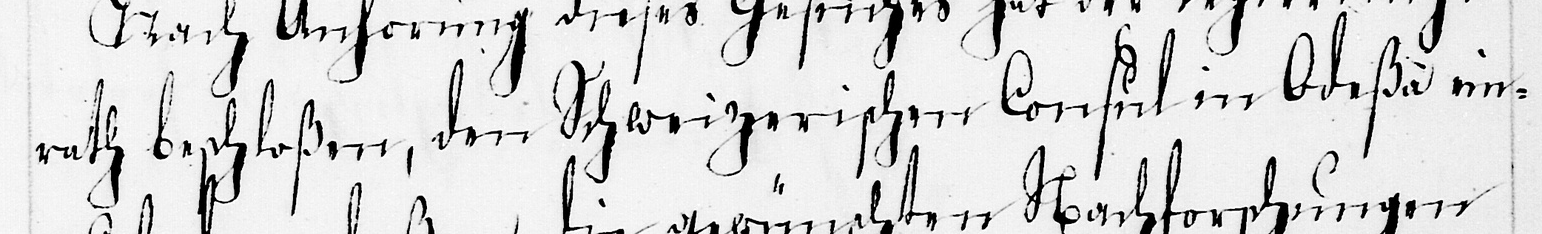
rath beschloßen, den Schweizerischen Consul in Odeßa ein¬
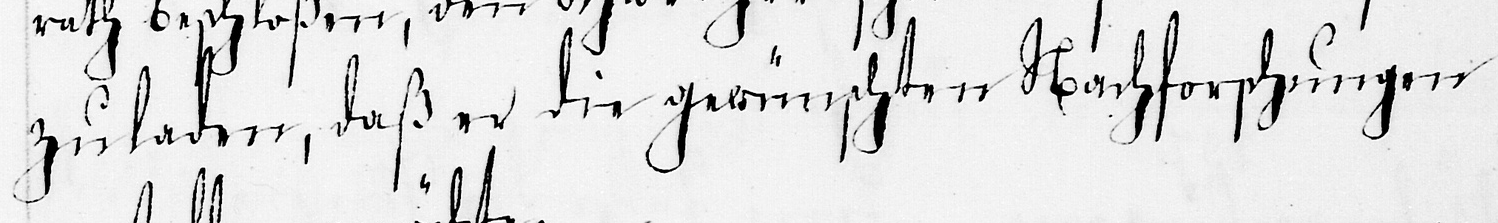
zuladen, daß er die gewünschten Nachforschungen
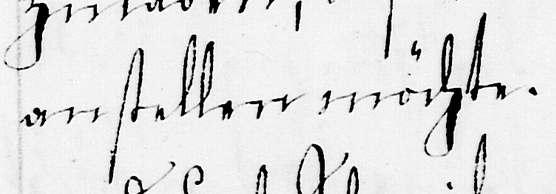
anstellen möchte.
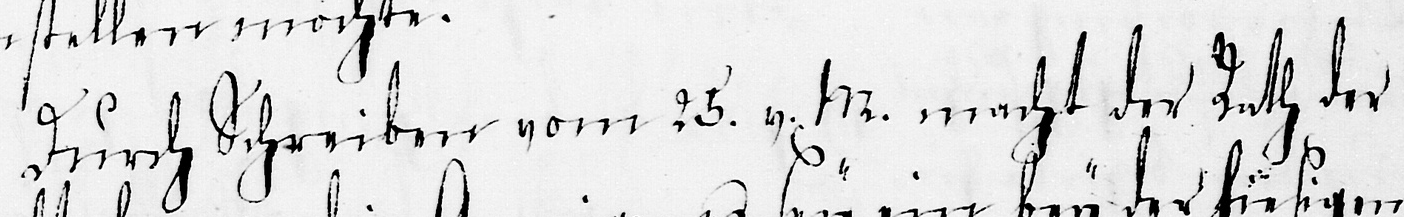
Durch Schreiben vom 25. v. M. macht der Rath der
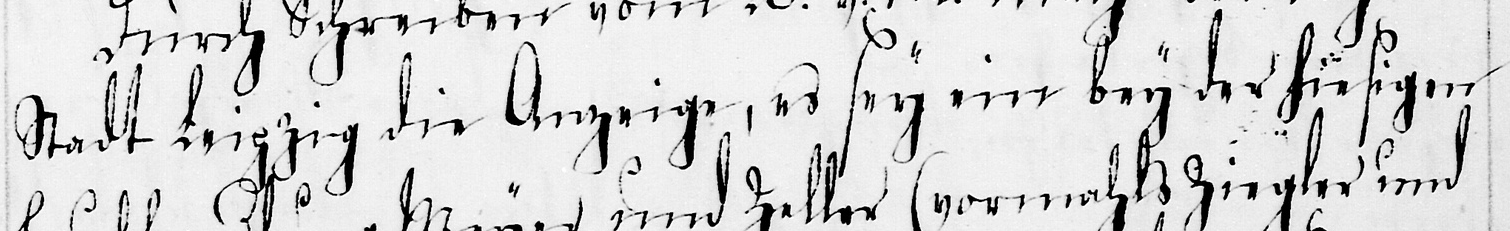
Stadt Leipzig die Anzeige, es sey ein bey der hiesigen
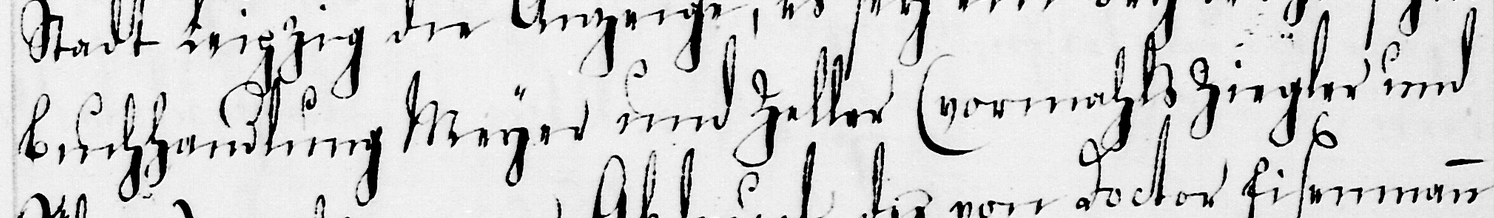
Buchhandlung Meyer und Zeller (vormahls Ziegler und
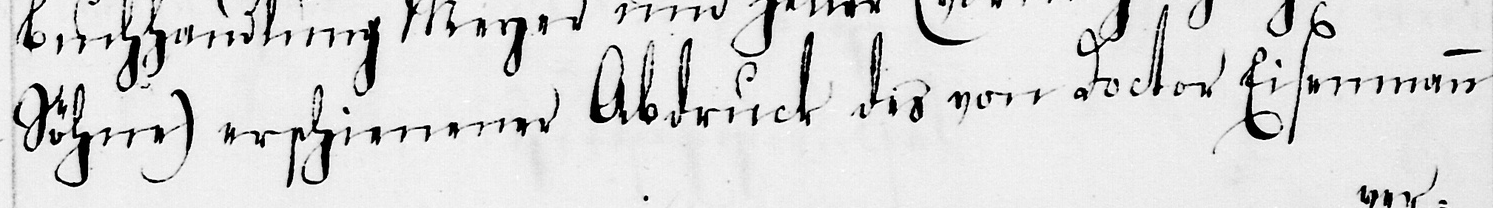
Söhne) erschienener Abdruck des von Doctor Eisenmann
